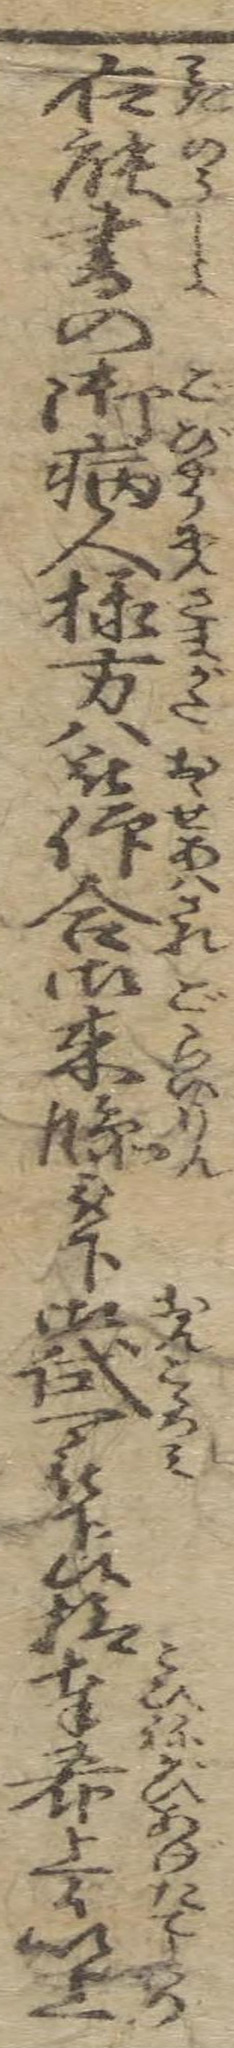右能書の御病人様方被仰合御来臨被下御試可被下候様奉希上候以上
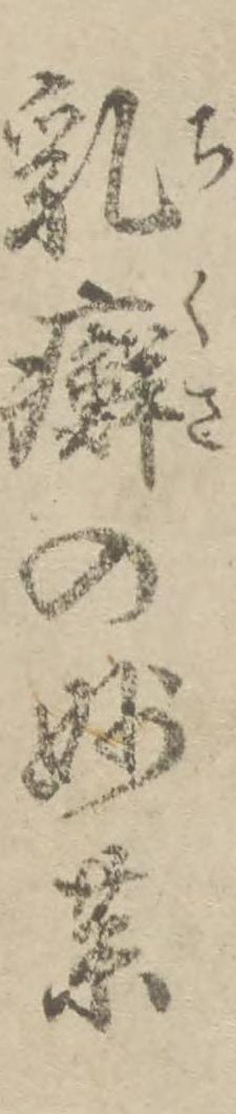乳癬の妙薬
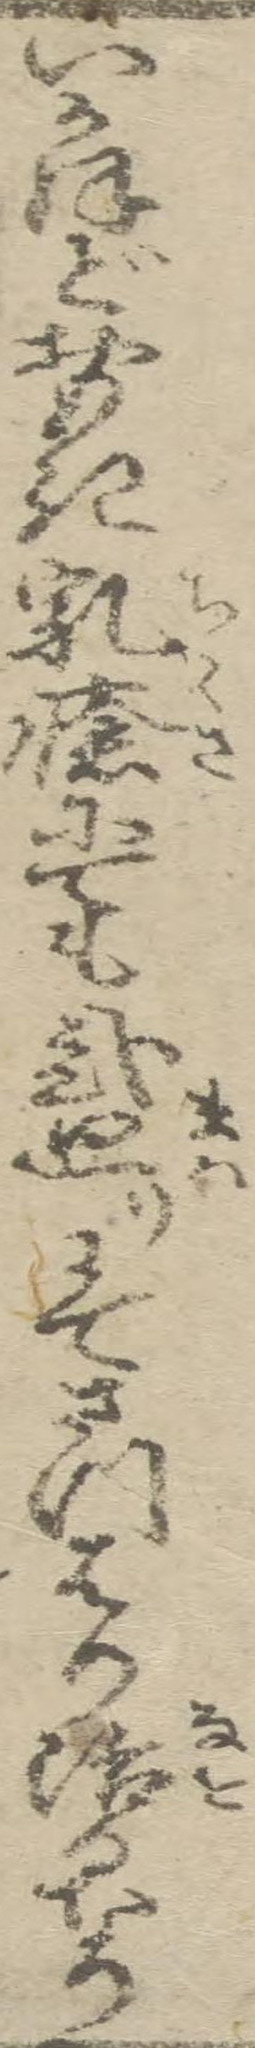いかほどおもき乳癬にても弐廻りにてさつはり治るなり
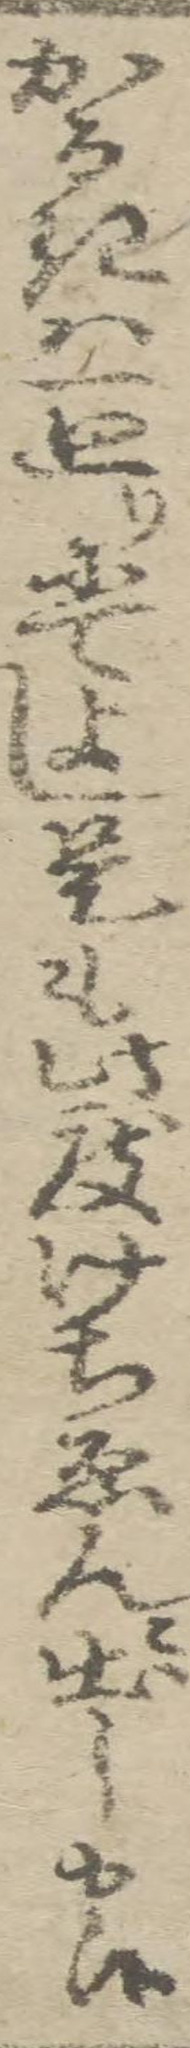かるきは一廻りにてよし是も此度けちゑんに出し申候

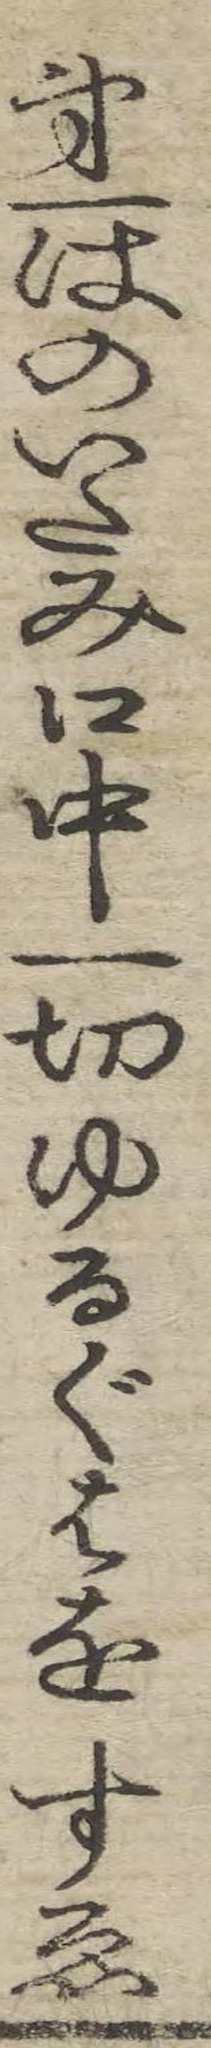第一はのいたみ口中一切ゆるぐはをすゑ
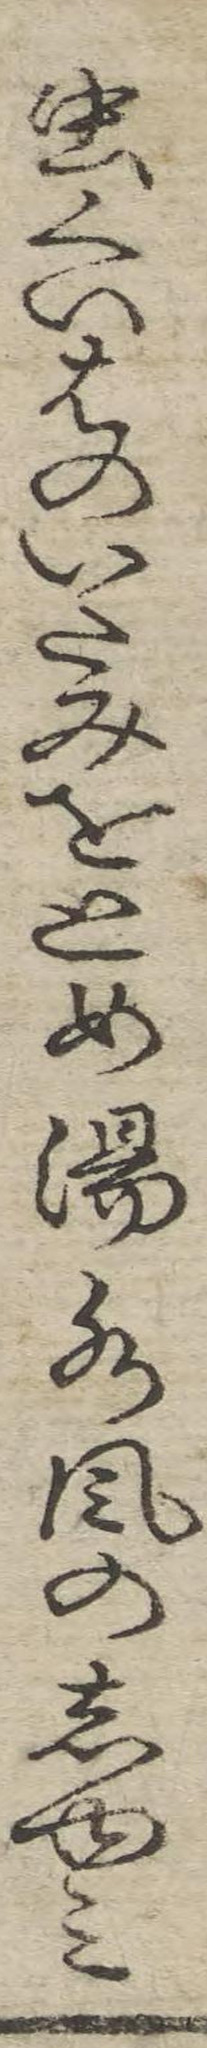虫くいはのいたみをとめ湯水風のしゆみ
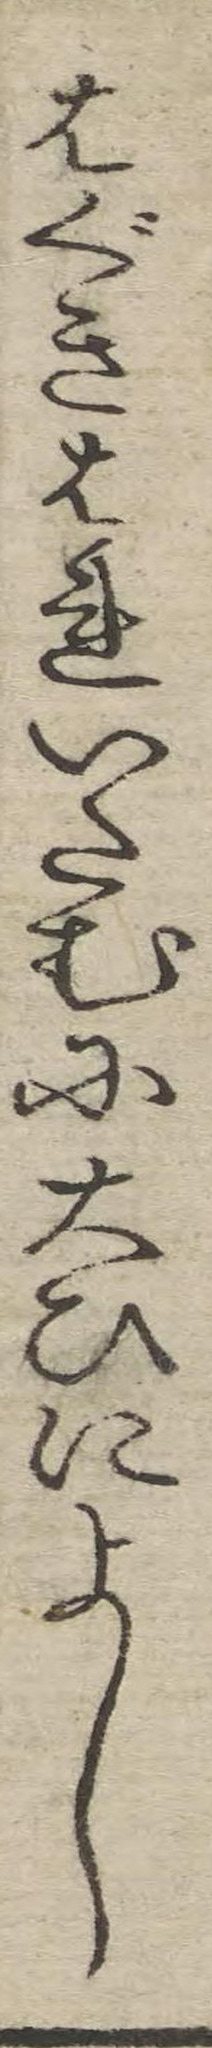はぐきはれいたむに大ひによし
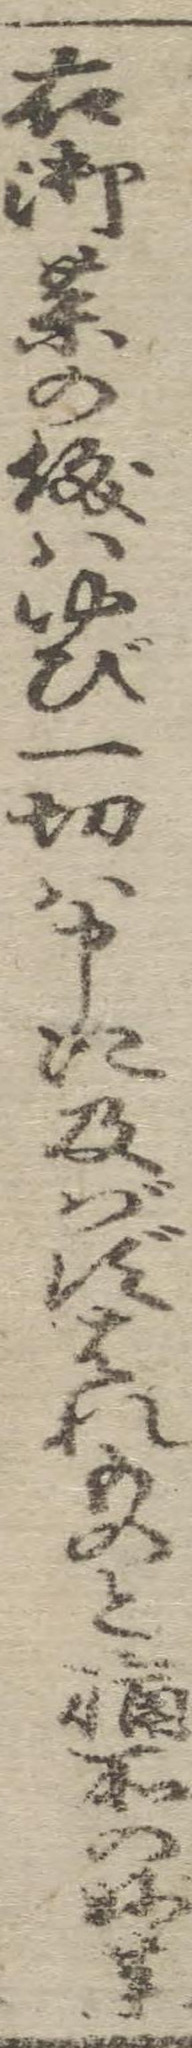右御薬の儀はゆび一切は申に及ばずはれものと痛所の妙薬
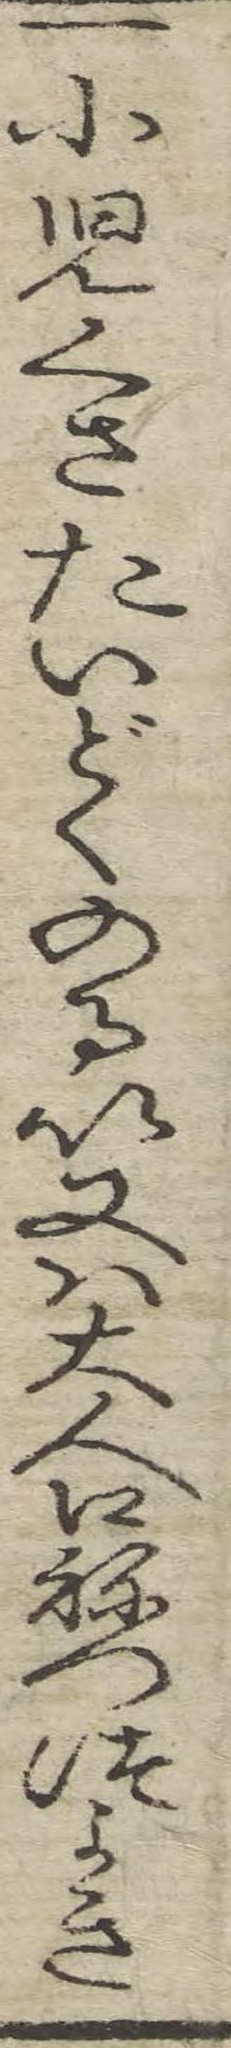一小児くさたいどくのるい又は大人口ねつつよき
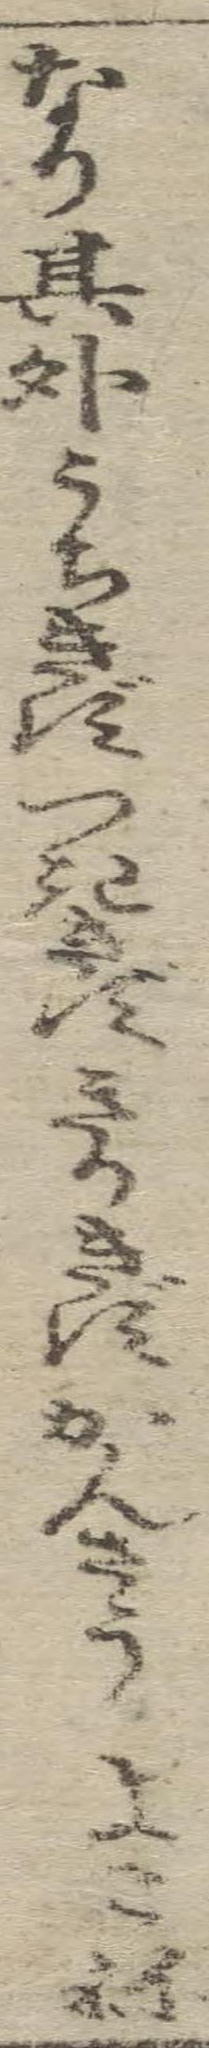なり其外うちきずつききずきりきずかんさうよこね
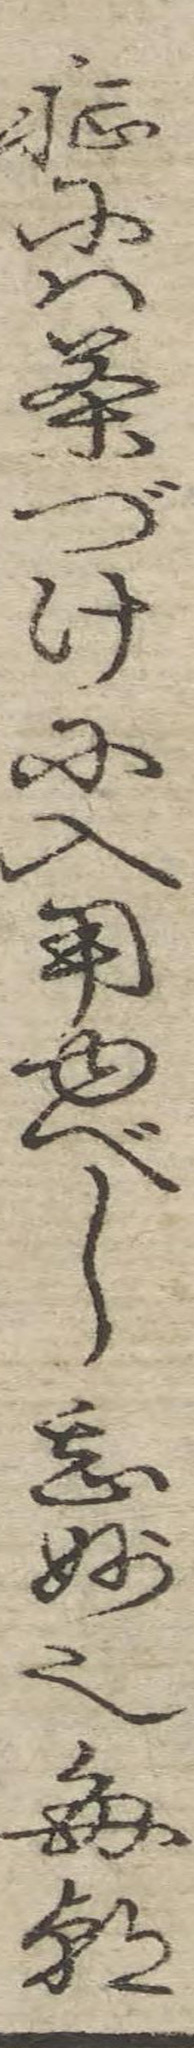症には茶づけに入用ゆべし甚妙也毎朝
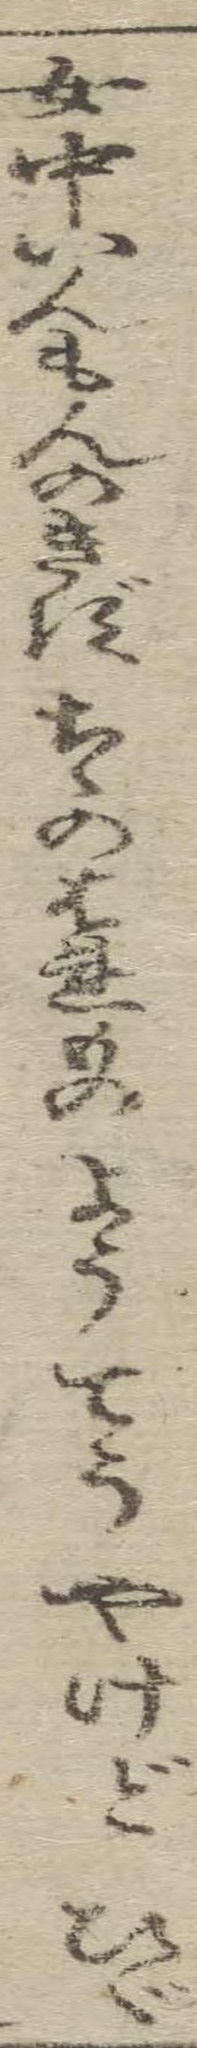女中いんもんのきずちゝのはれものようてうやけどひゞ
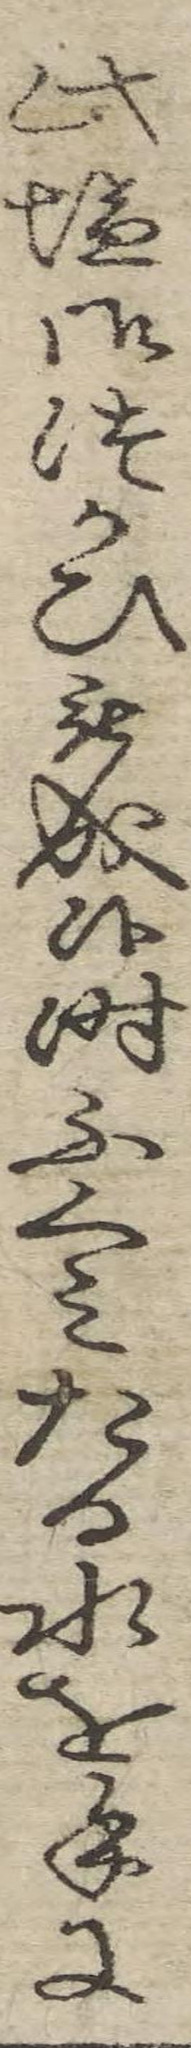此塩御つかひ被成候時ふくみたる水を手に
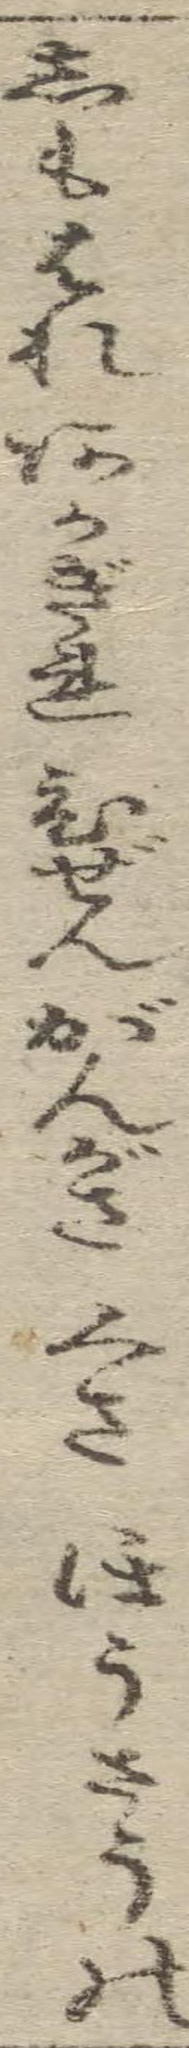しもはれあかぎれひぜんがんがさくさほうさうの
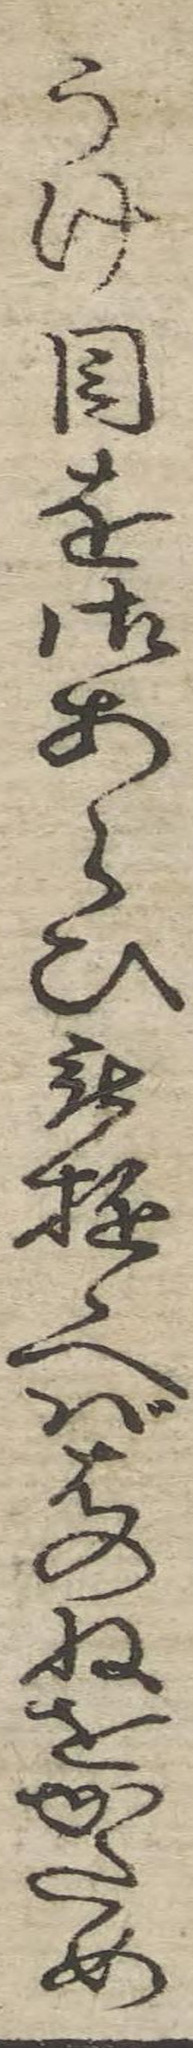うけ目を御あらひ被遊候へばはのねをかため
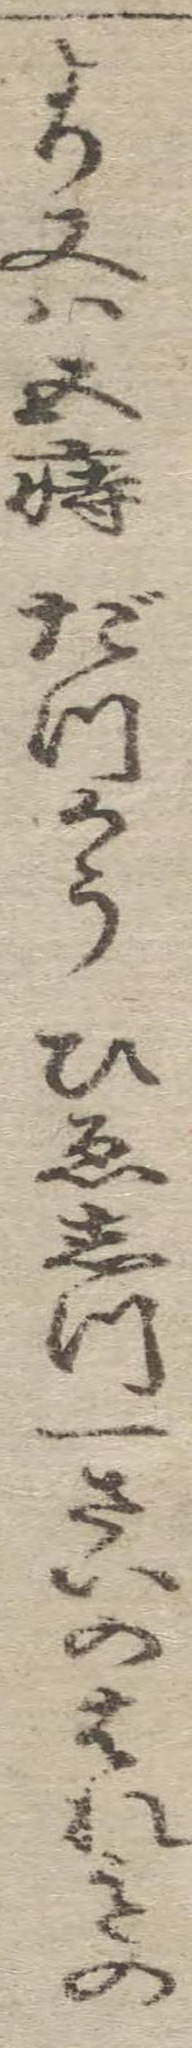より又は五痔だつかうひゑしつ一さいのはれもの
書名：浪華薬種問屋能書張交帖. 二
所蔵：国立国会図書館 National Diet Library, JAPAN
